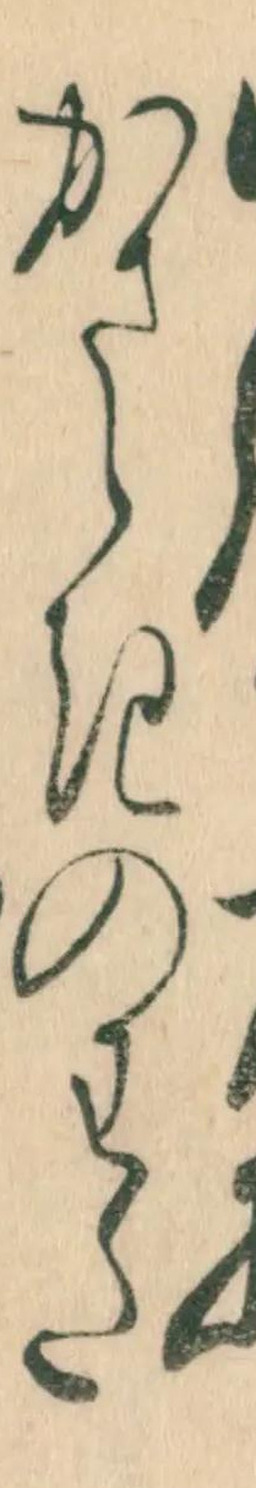かさゝきのわた
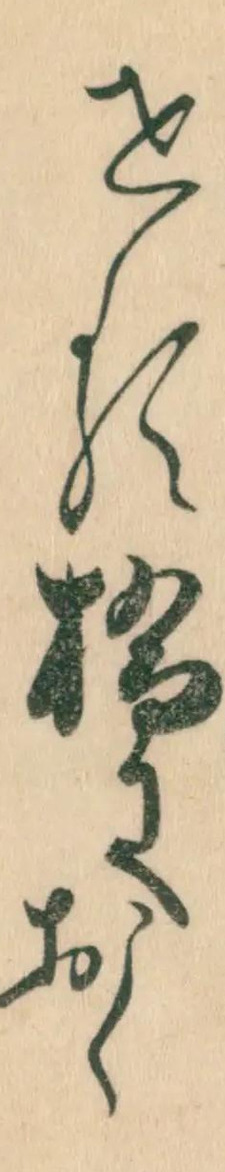せる橋におく
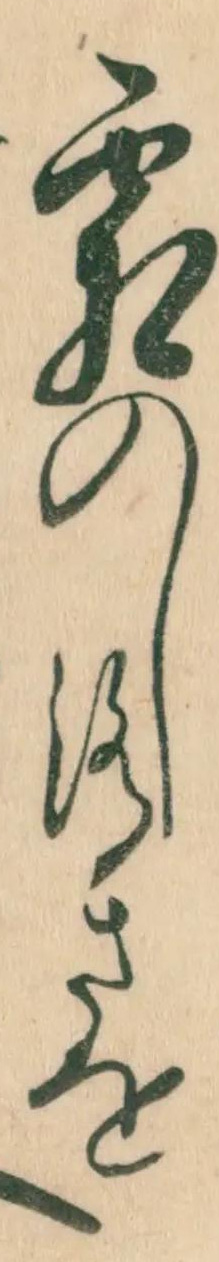霜のしろきを
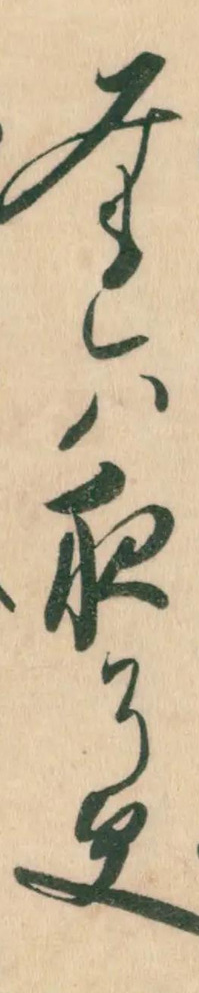みれは夜そ更
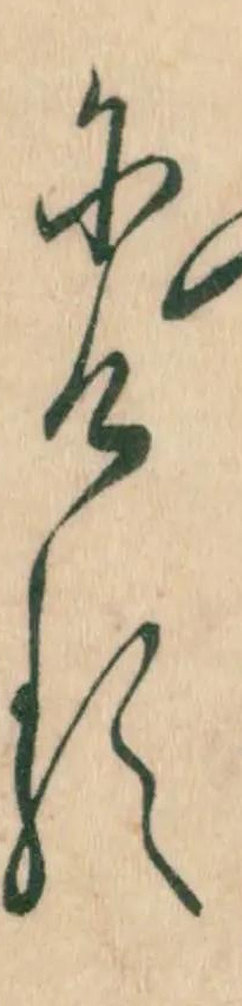にける
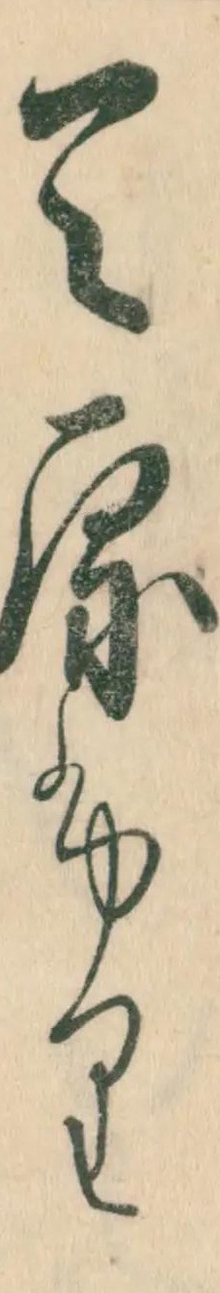天原ふり
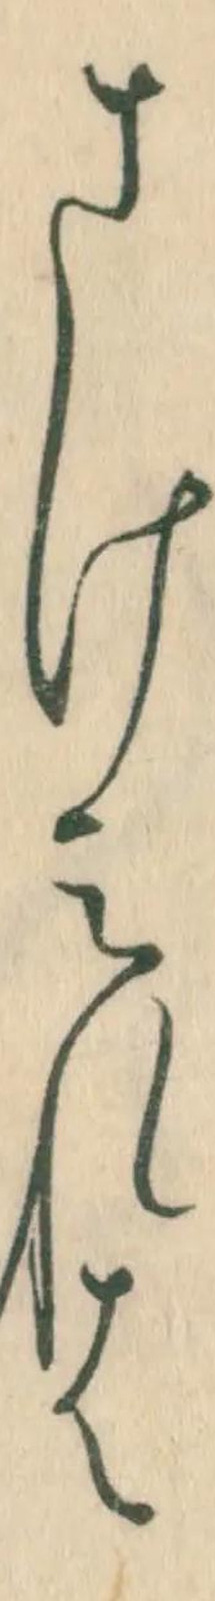さけみれは
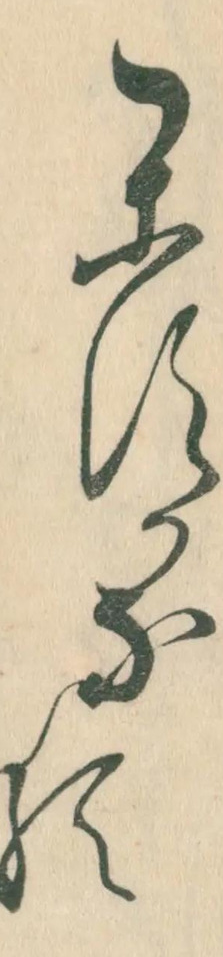かすかなる
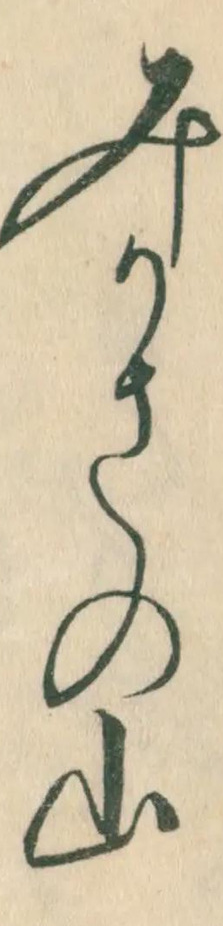みかさの山
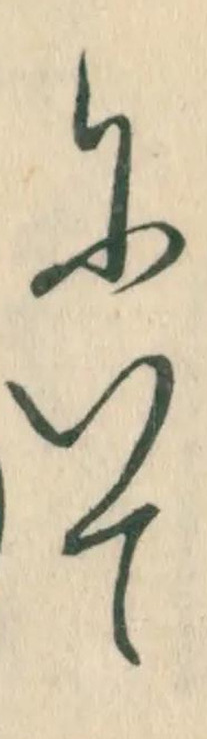にいて
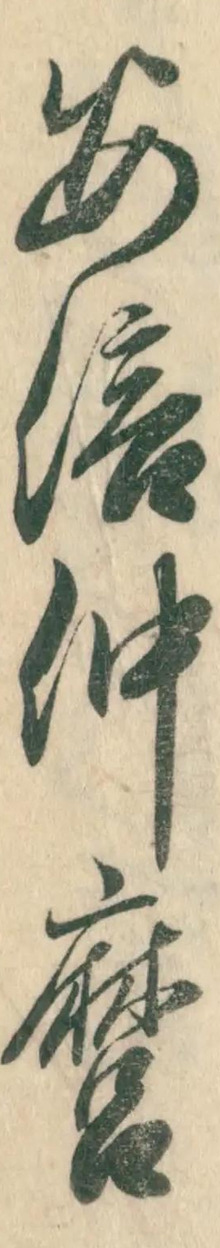安倍仲麿

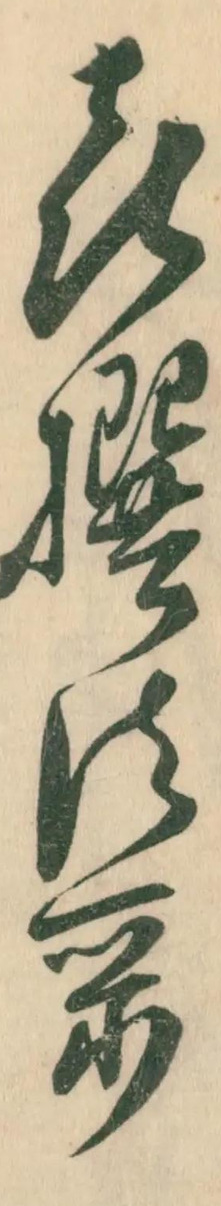喜撰法師
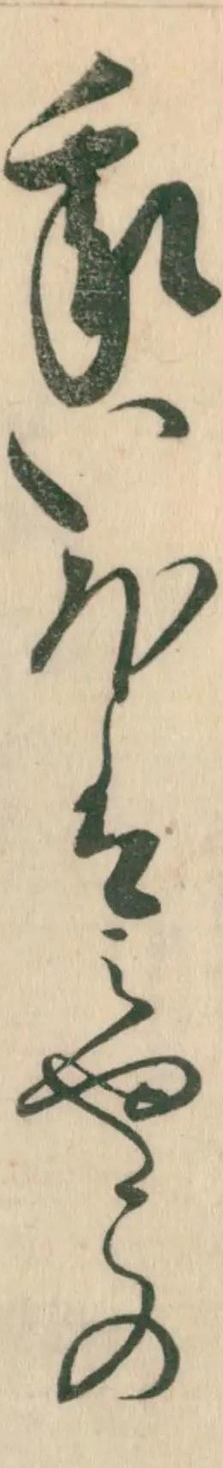我いほはみやこの
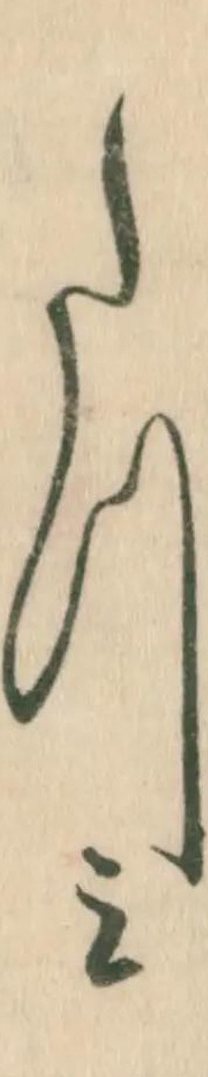たつみ
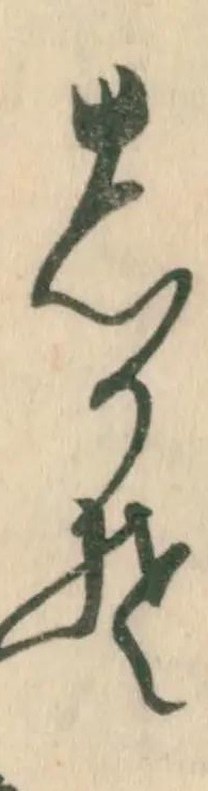しかそ
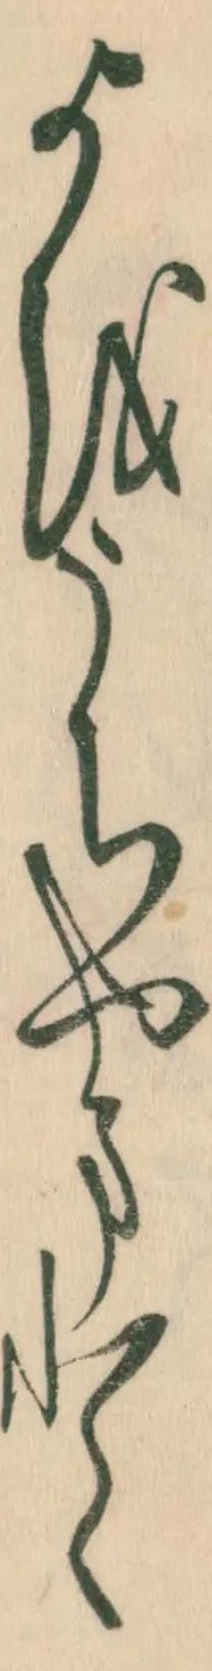よをうちやまと
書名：錦百人一首あつま織
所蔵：国立国会図書館 National Diet Library, JAPAN
